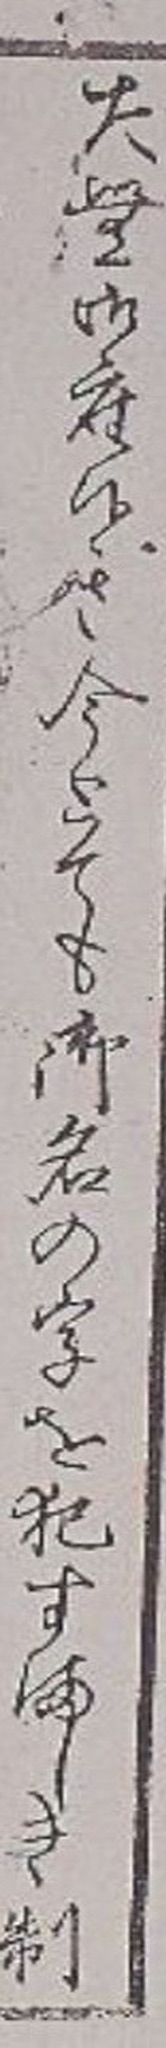た無御座候き今とても御名の字を犯すましき制
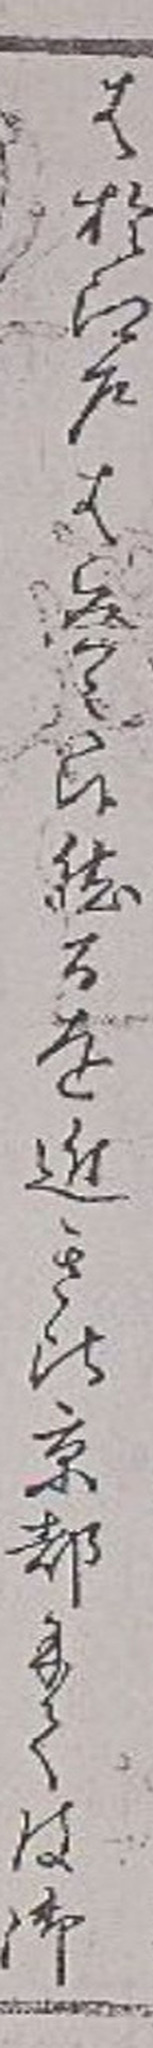は於江戸は有之候然るを近き頃京都にては御
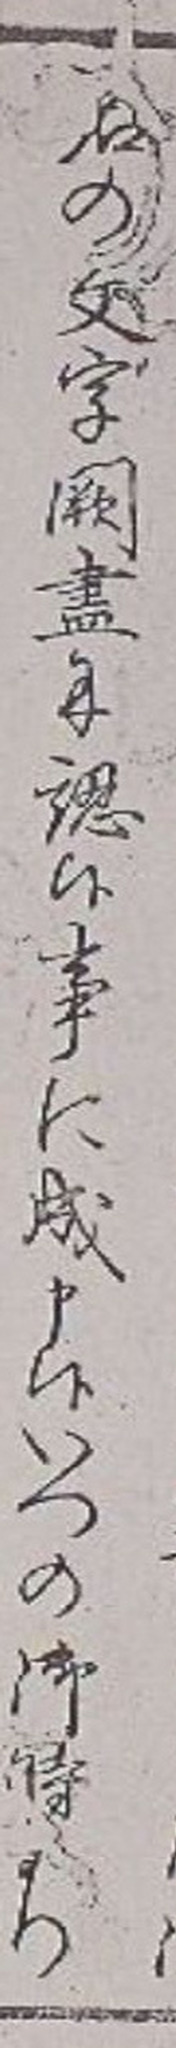名の文字闕盡に認候事に成申候いつの御時より
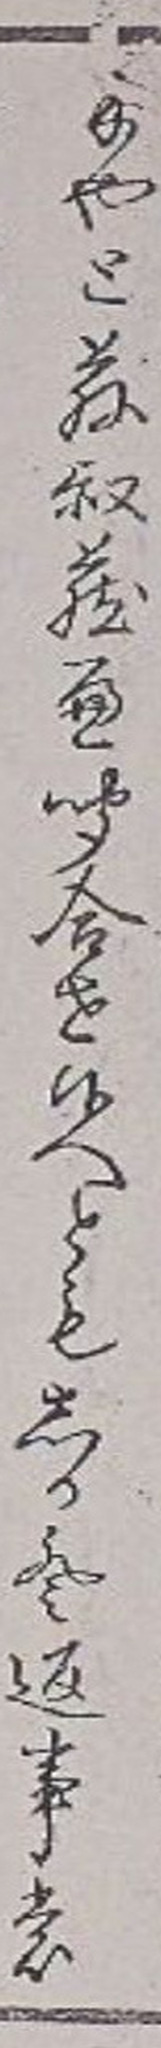にやと藤叔蔵へ聞合せ候へともしかと返事も
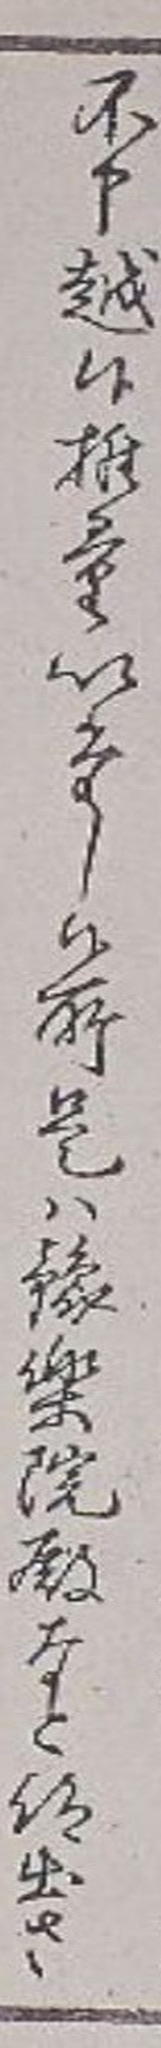不申越候推量いたし候所是は予楽院殿なと仰出さ
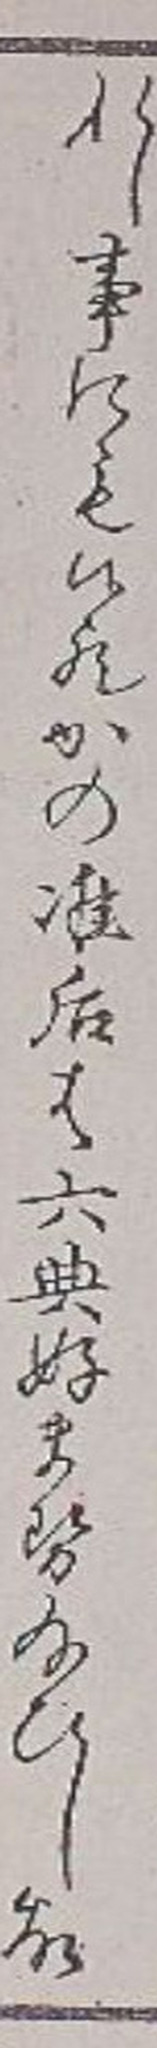れし事にも候歟かの准后は六典好ませ給ひし故
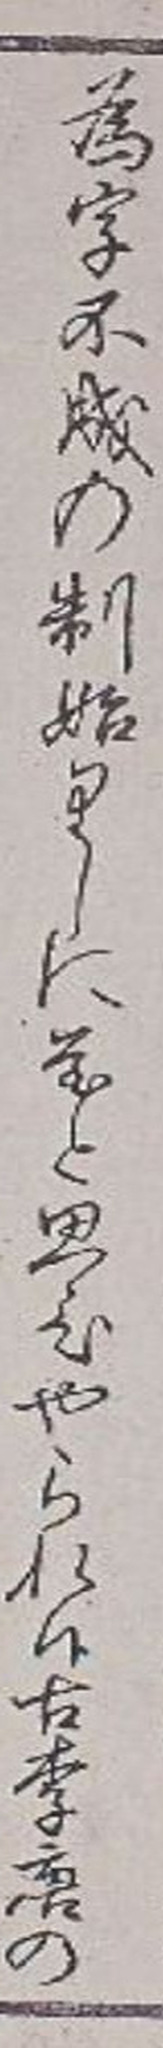為字不成の制始りしにやと思ひやられ候古き唐の
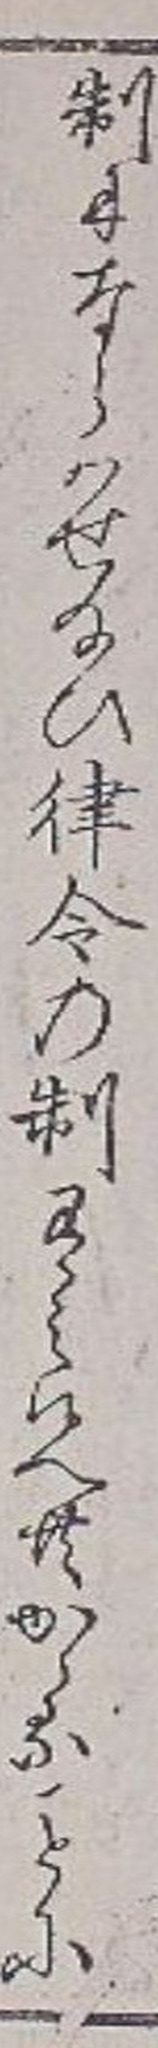制にならはせ給ひ律令の制有之候へ共かゝることに
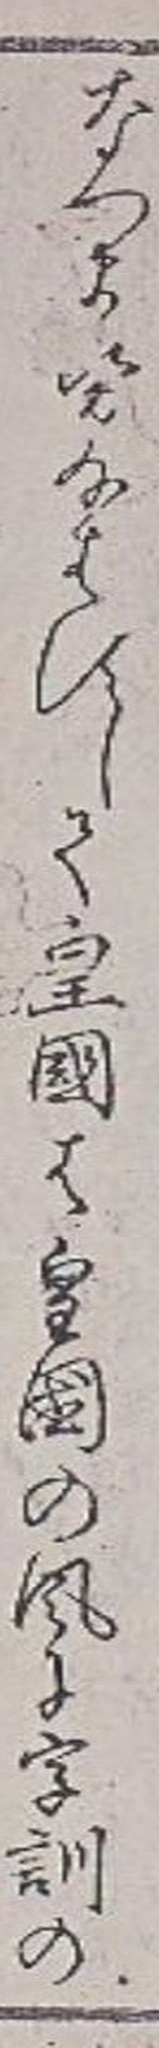なつませ給はすして皇国は皇国の風に字訓の
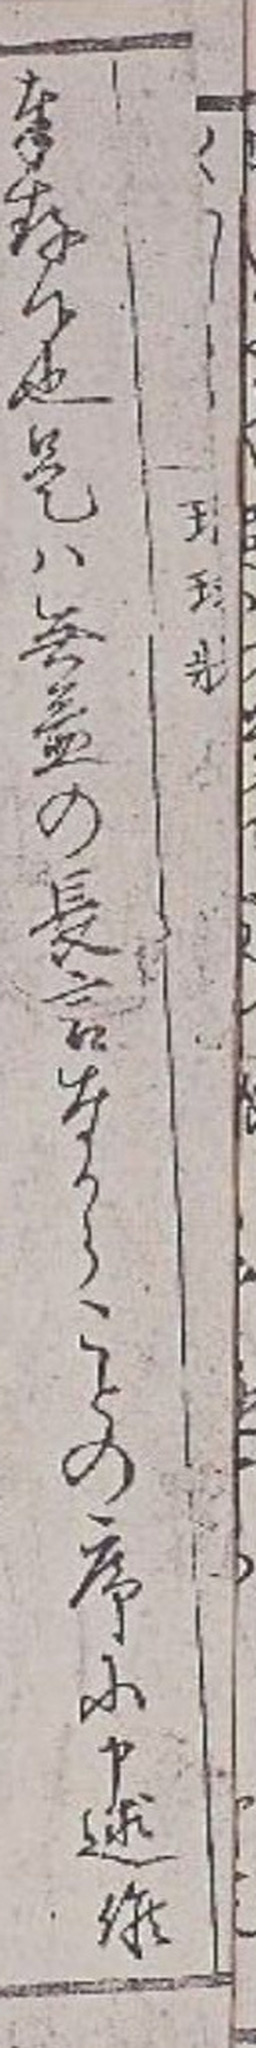奉存候也是は無益の長言なからことの序に申述候
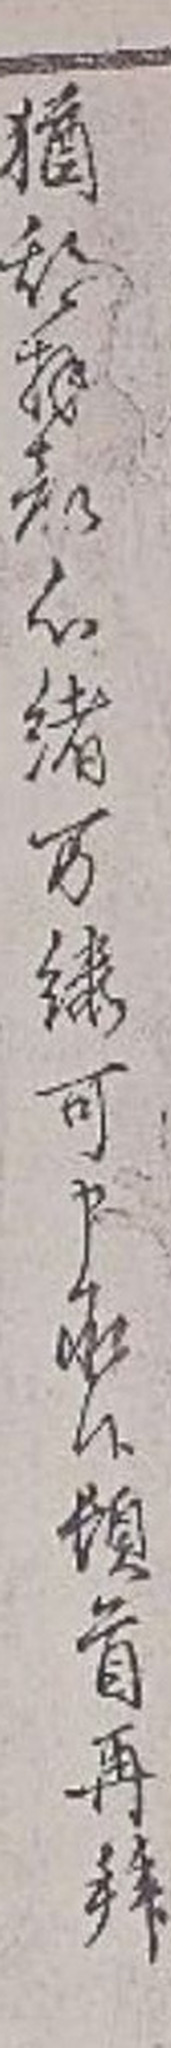猶期拝顔心緒万縷可申承候頓首再拝
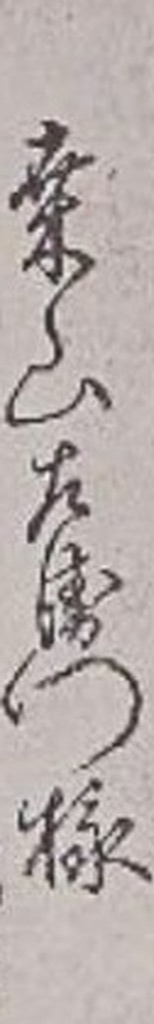桑山左衛門様
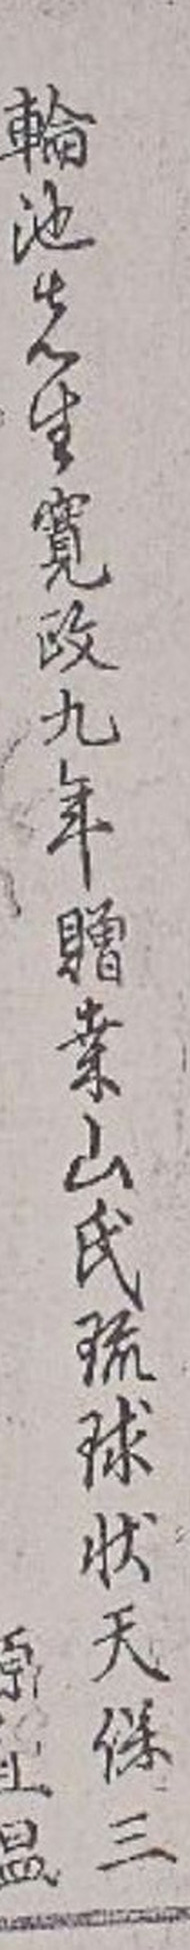輪池先生寛政九年贈桑山氏琉球状天保三
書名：琉球状
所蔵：University of the Ryukyus Library
